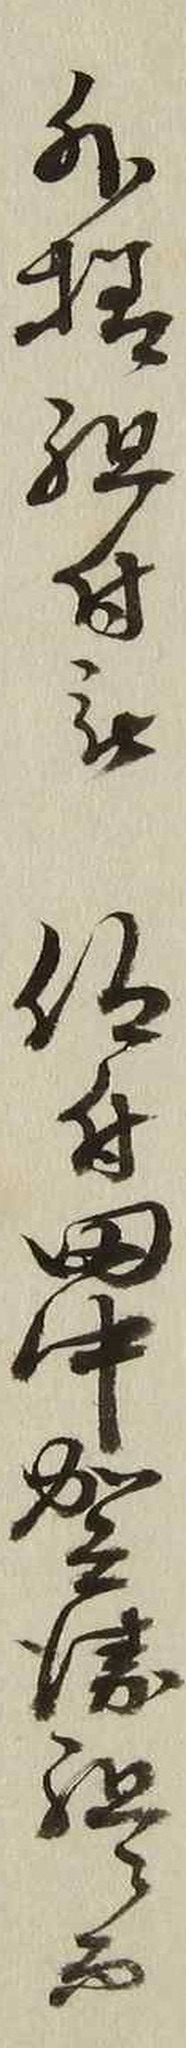外様組付被仰付田中加兵衛組ニ而
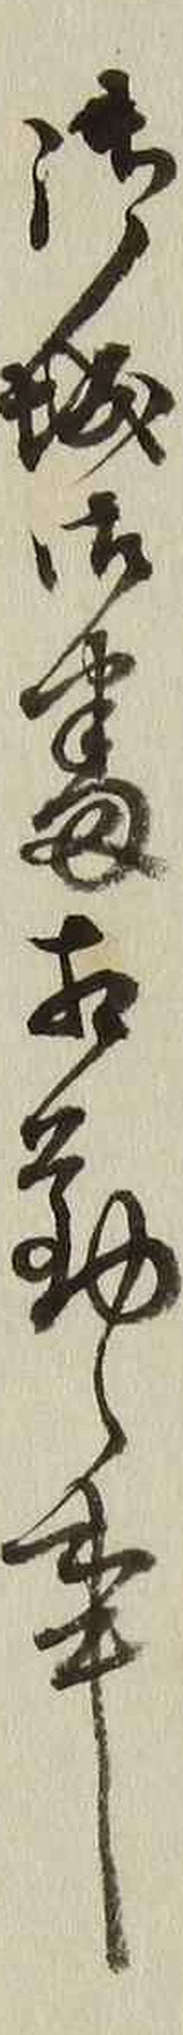御城御番相勤候事
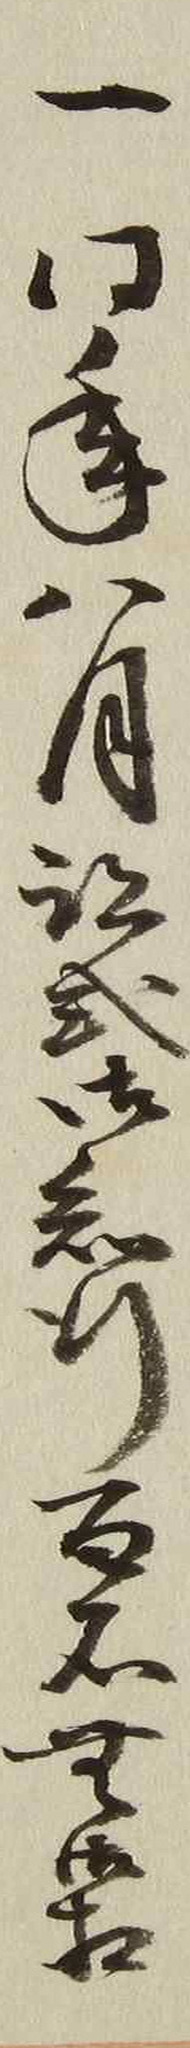一同年八月跡式御知行百石無御相
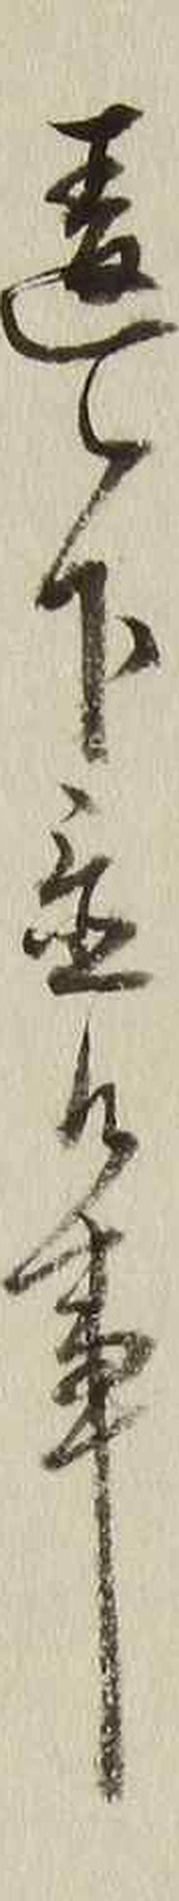違被下置候事
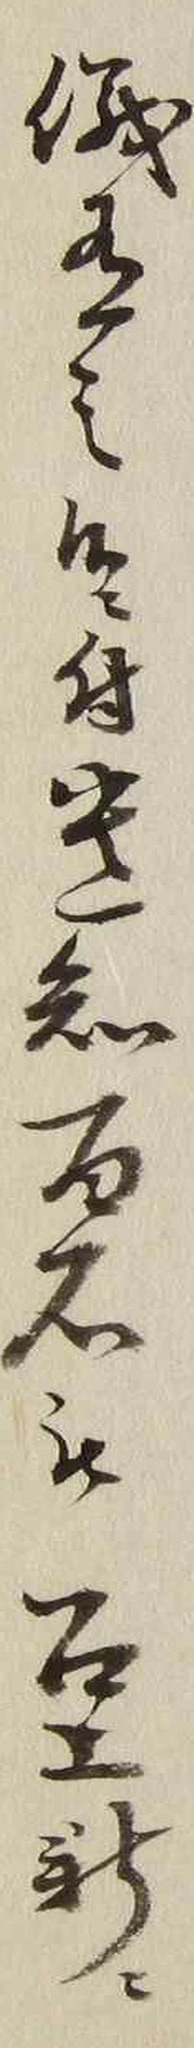儀有之候ニ付遺知百石被召上新ニ
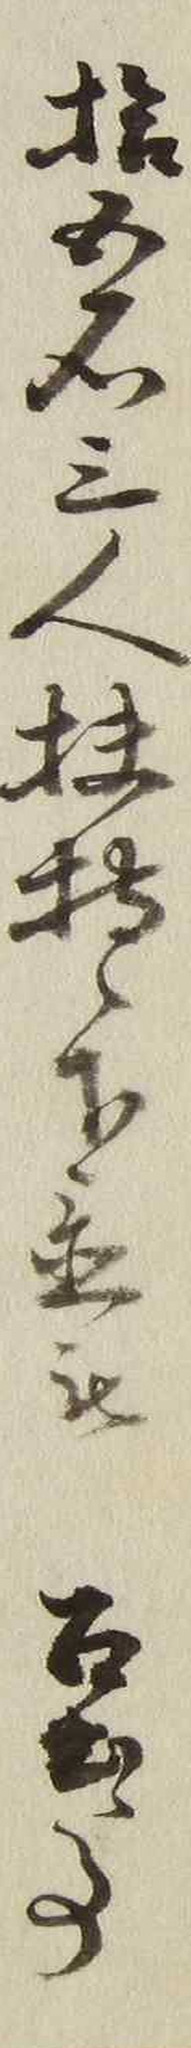拾五石三人扶持被下置被召出候事
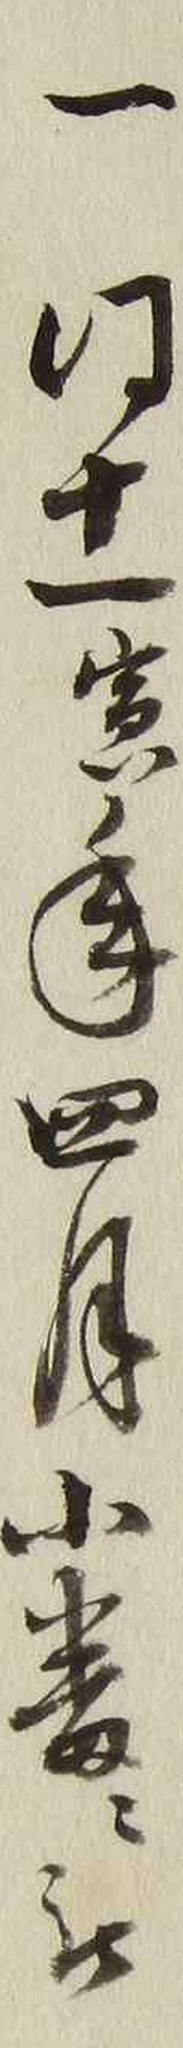一同十一寅年四月小番ニ被
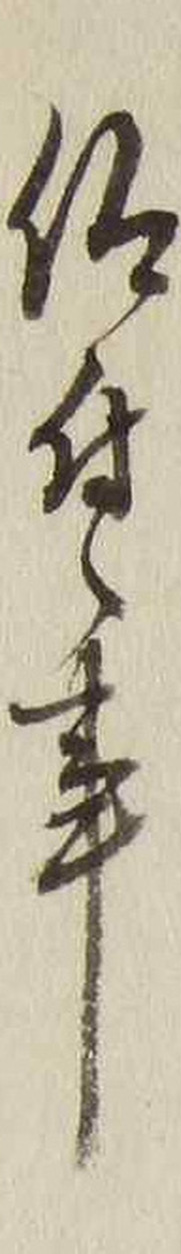仰付候事
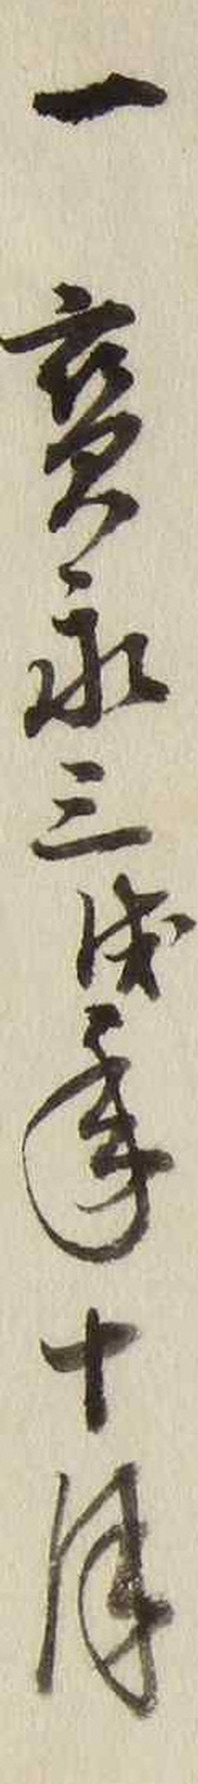一宝永三戌年十月

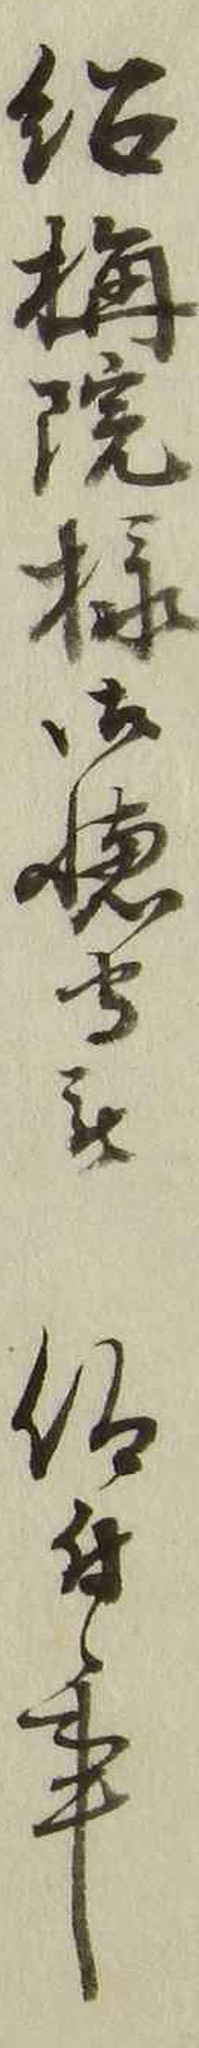紹栴院様御懐守被仰付候事
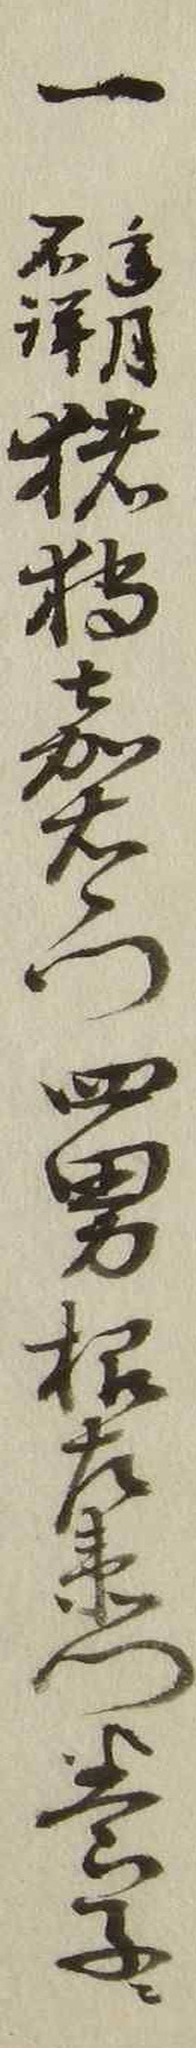不詳猪狩嘉右衛門四男根左衛門養子ニ
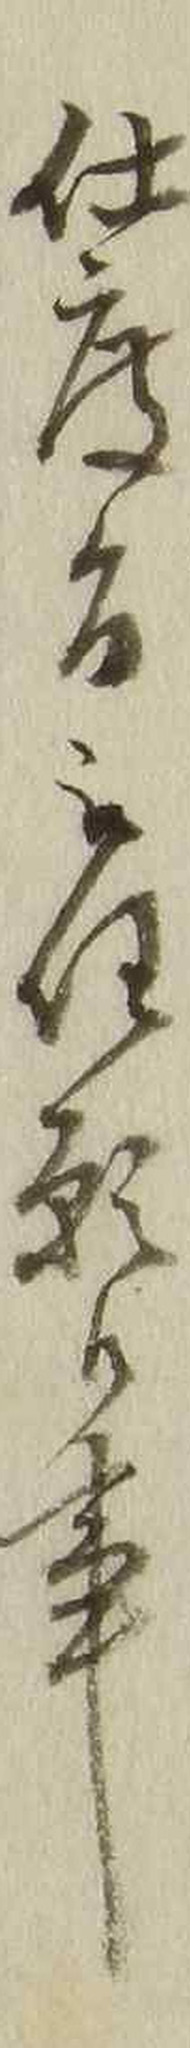仕度旨被任願候事
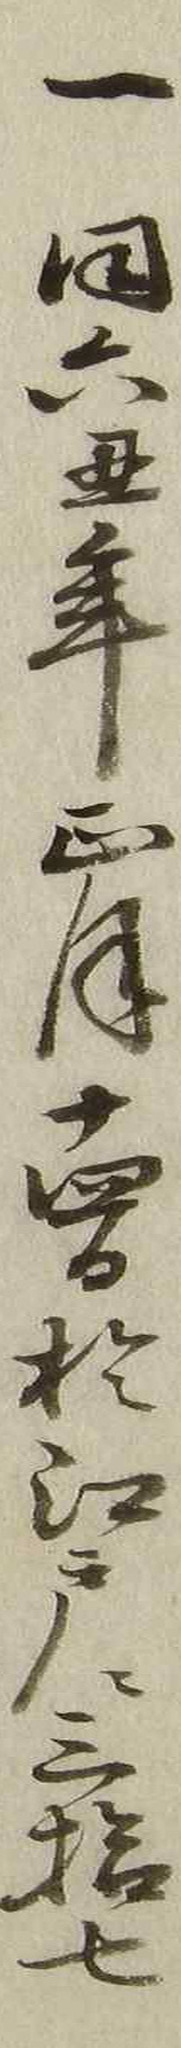一同六丑年正月十四日於江戸ニ三拾七
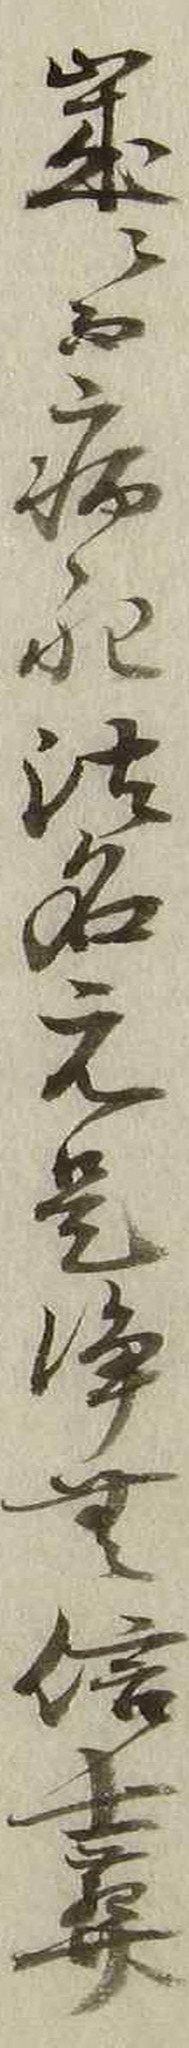歳ニ而病死法名元是浄無信士葬
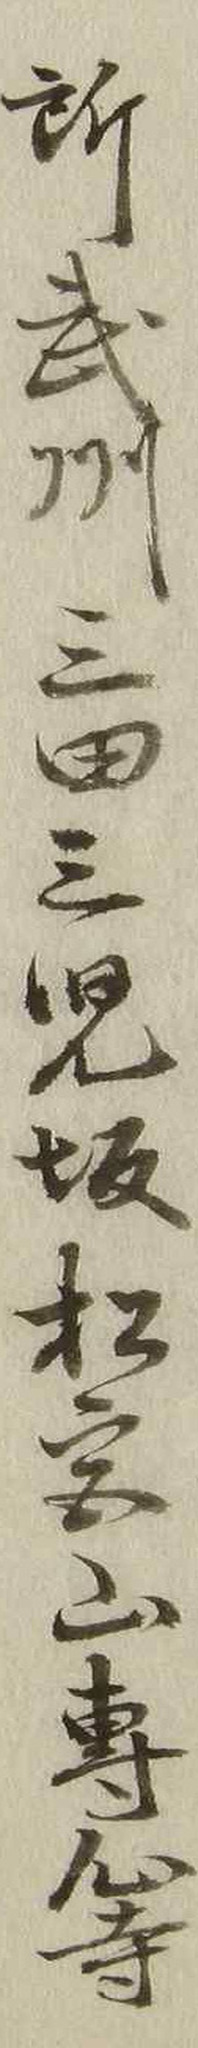所武州三田三児坂松宮山専心寺
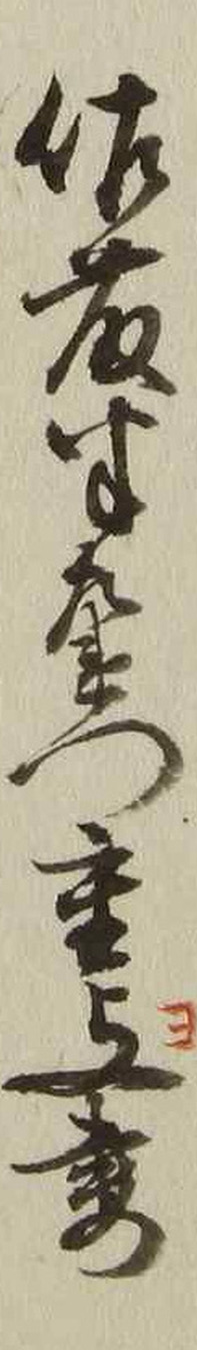佐藤半左衛門重与妻
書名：諸士系譜　巻之27　い之部27
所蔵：会津若松市立会津図書館
